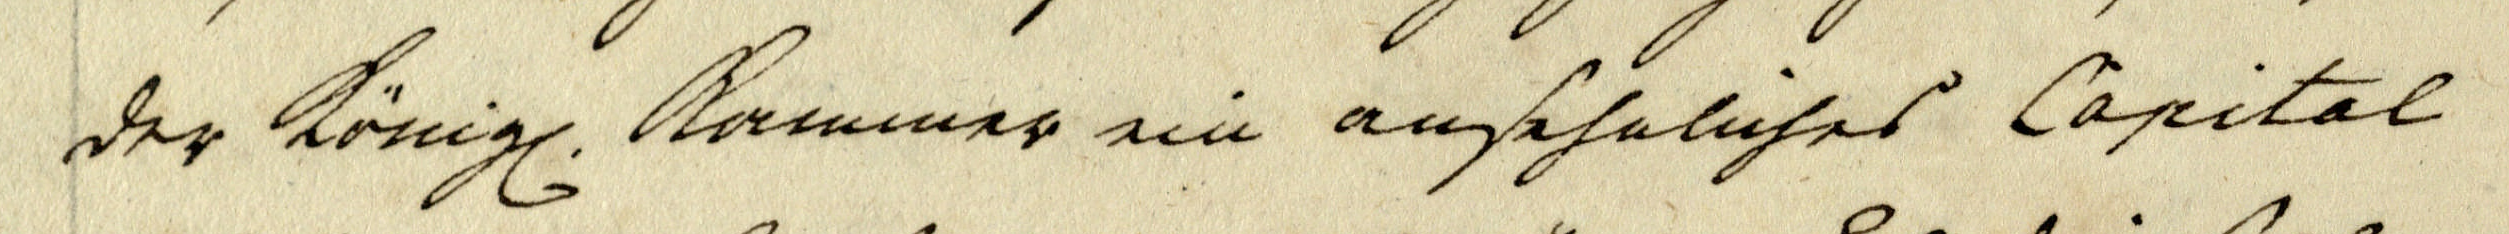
der Königl. Kammer ein ansehnliches Capital
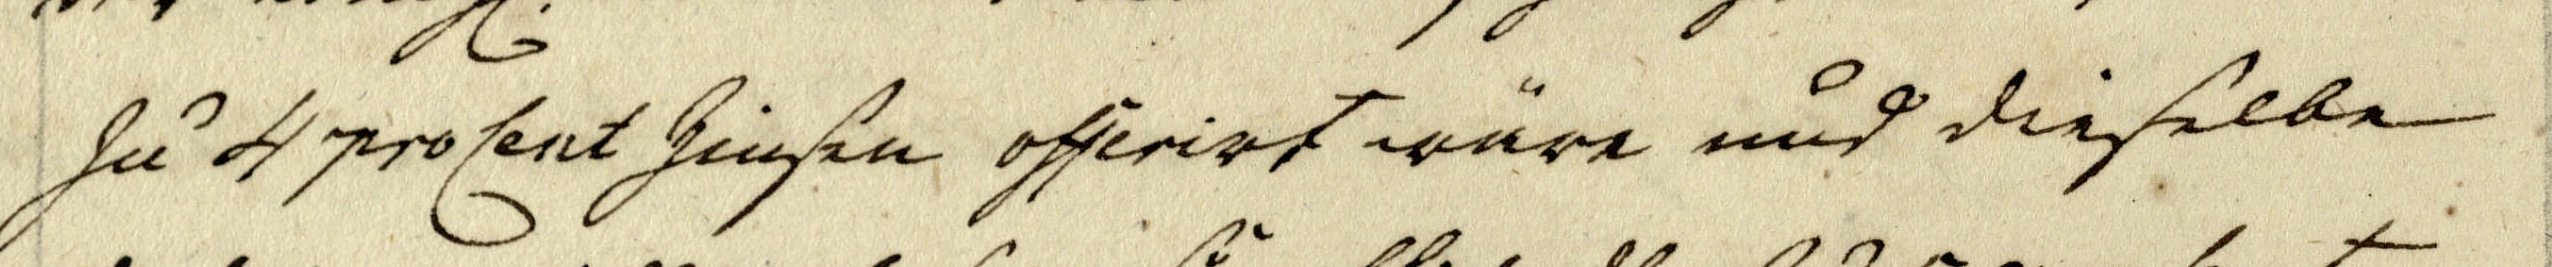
zu 4 proCent Zinsen offerirt wäre und dieselbe
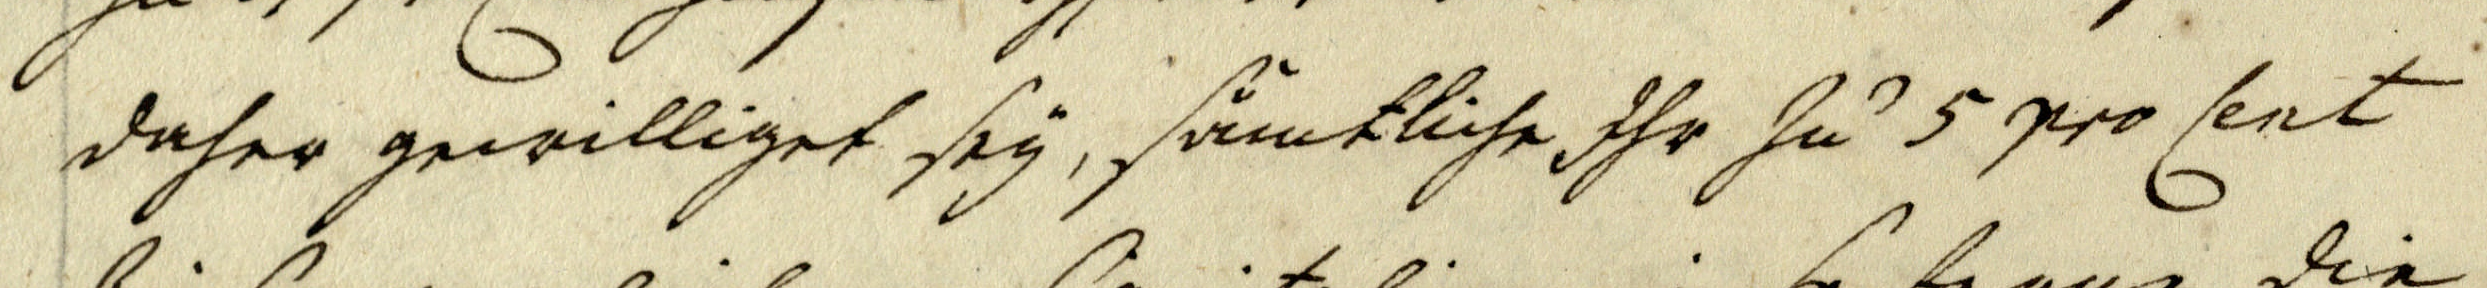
daher gewilliget seÿ, sämtliche Ihr zu 5 pro Cent
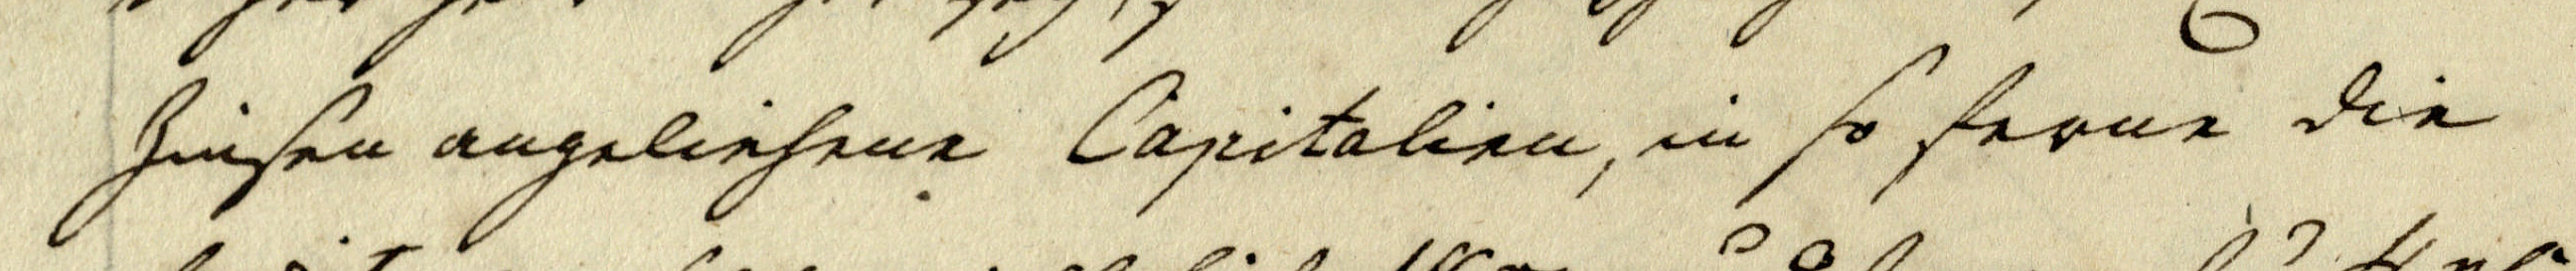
Zinsen angeliehene Capitalien, so ferne die
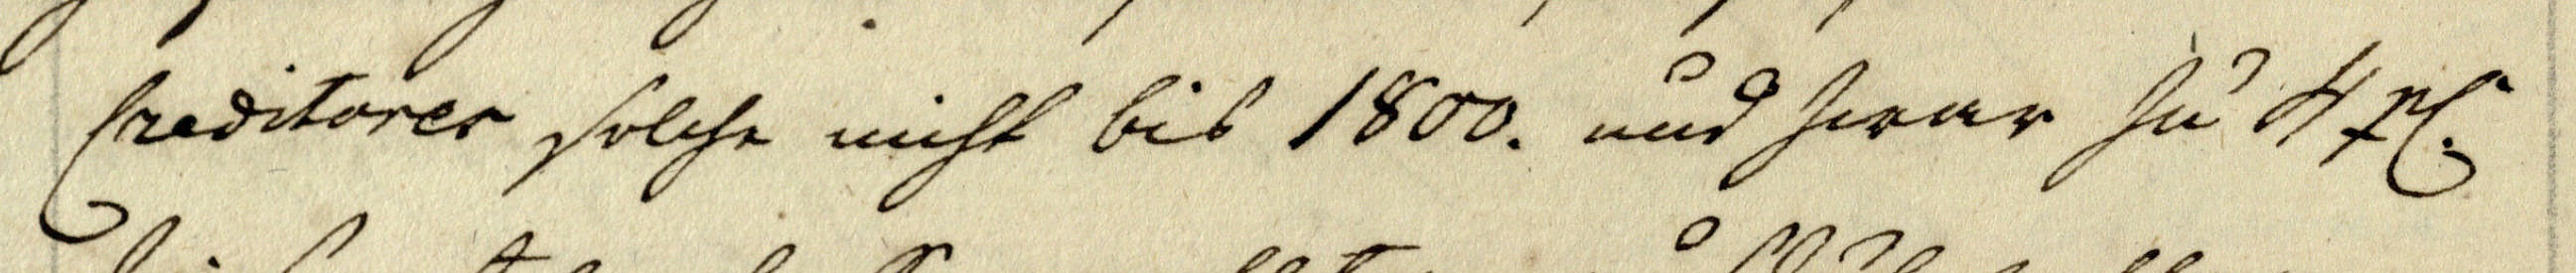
Creditores solche nicht bis 1800. und zwar zu 4 pl.
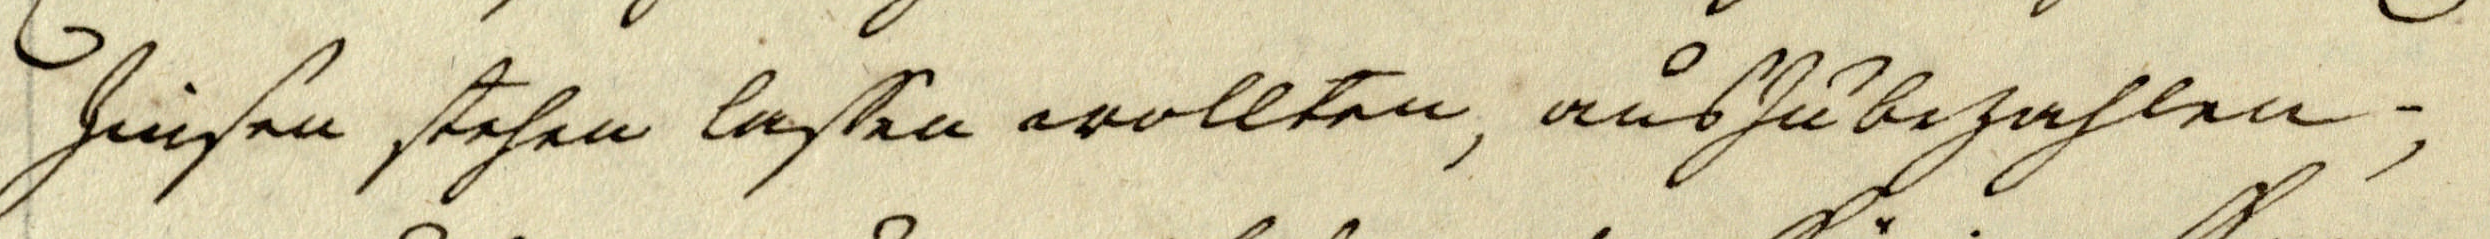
Zinsen stehen lassen wollten, auszubezahlen,
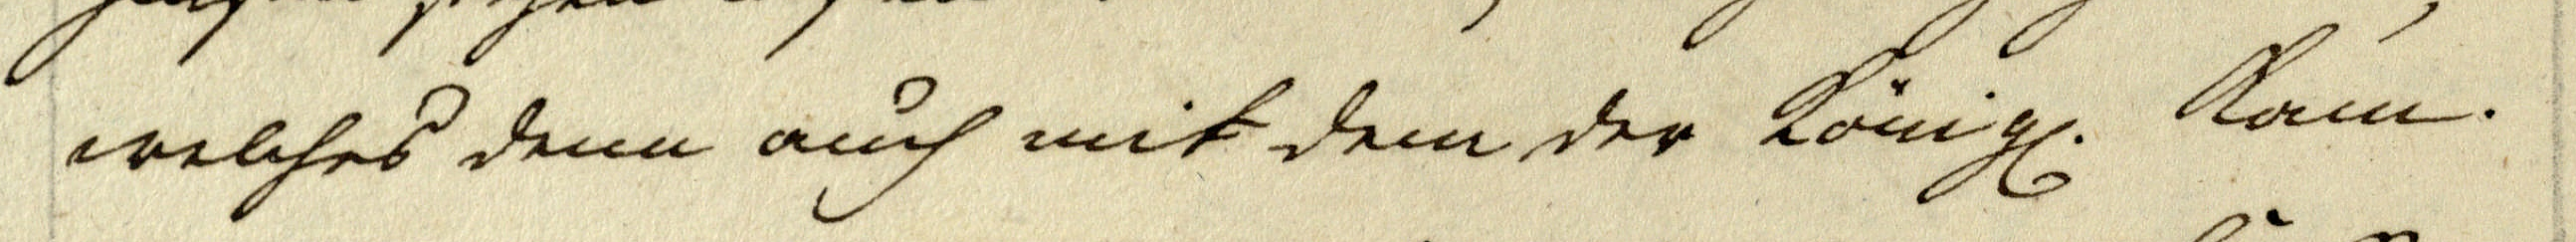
welches denn auch mit dem der Königl. Kam¬
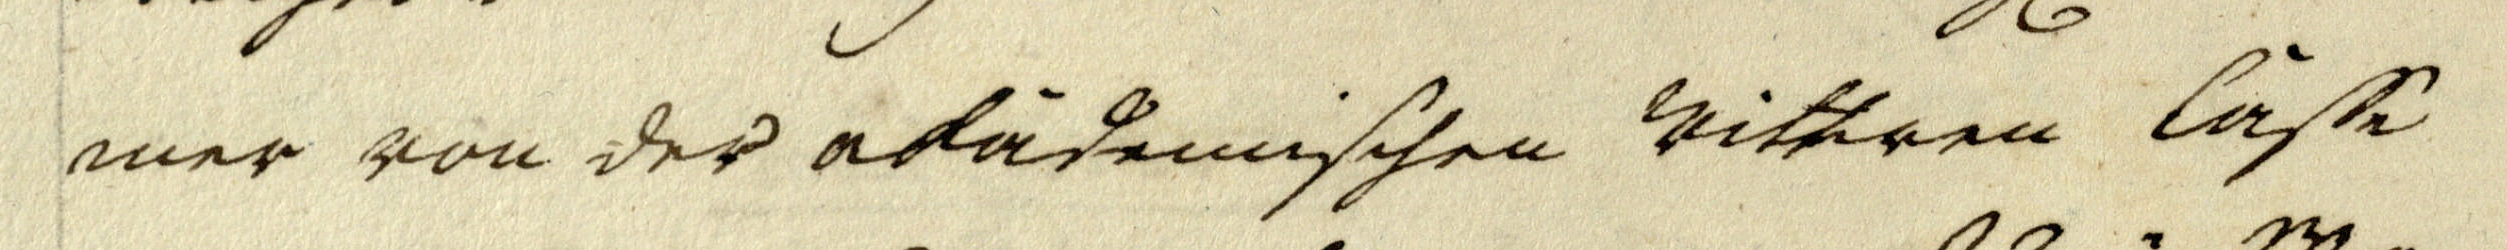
mer von der akademischen Wittwen Casse
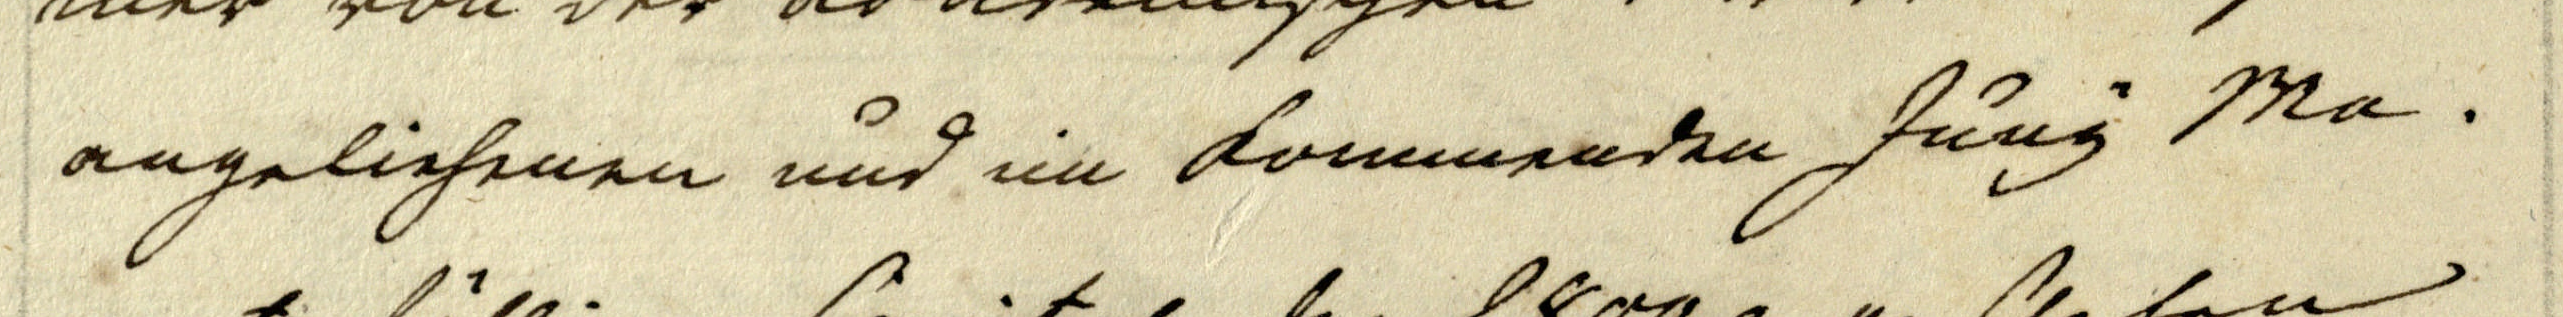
angeliehenen und im kommenden Junÿ Mo¬
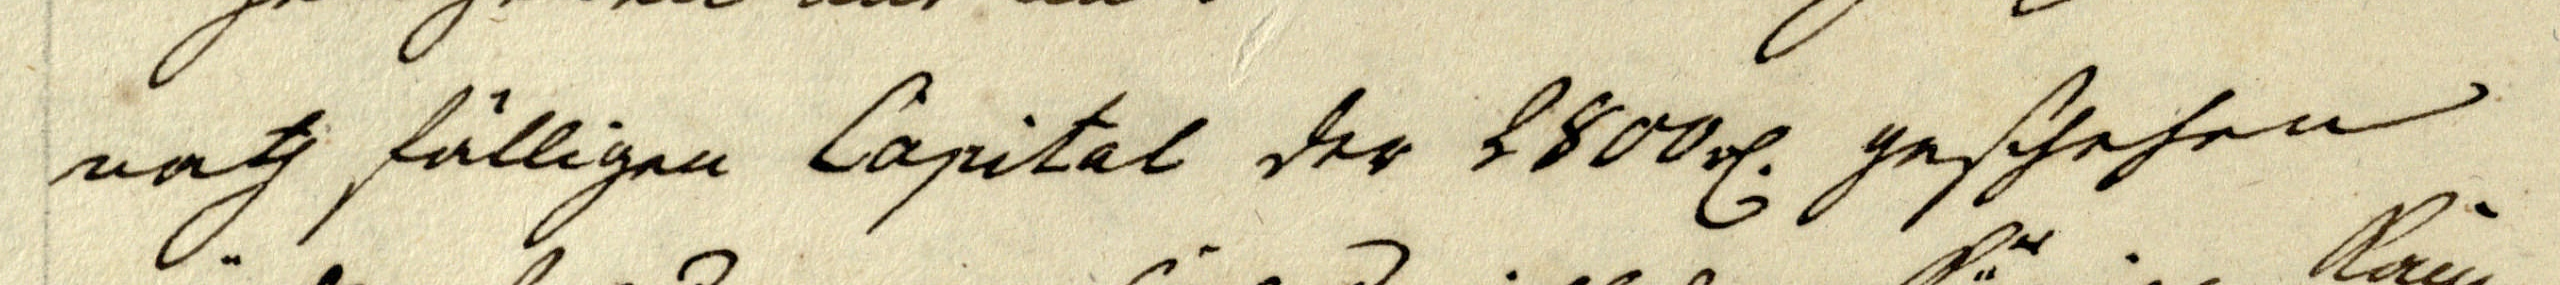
nath fälligen Capital der 2800 rl. geschehen
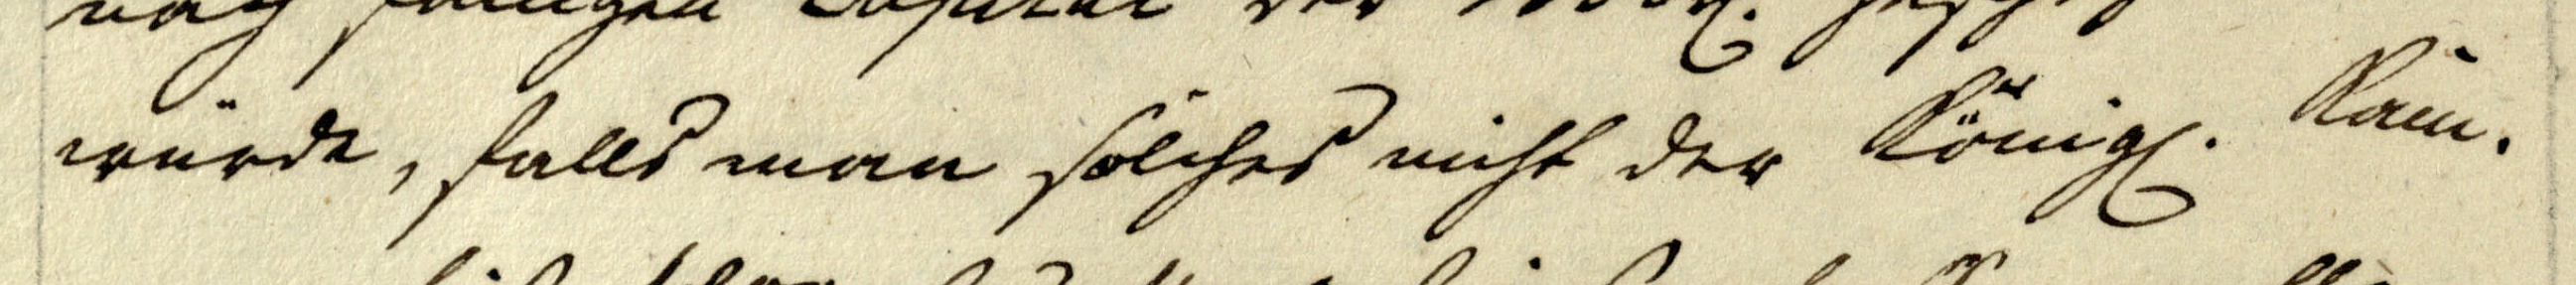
würde, falls man solches nicht der Königl. Kam¬
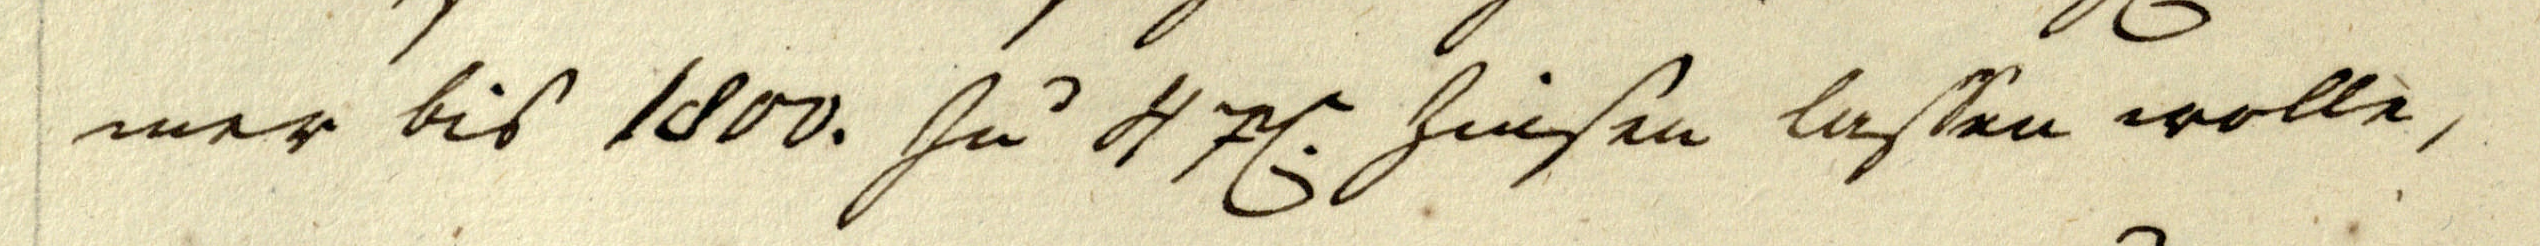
mer bis 1800. zu 4 pl. Zinsen lassen wolle,
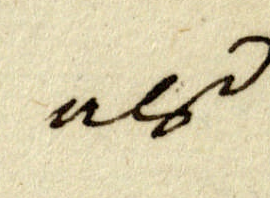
als
